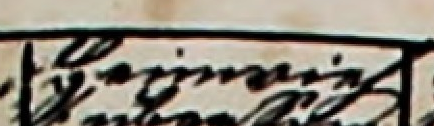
Heimvieh
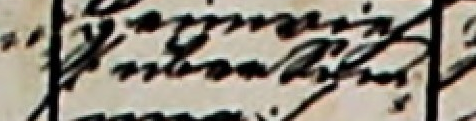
über S???
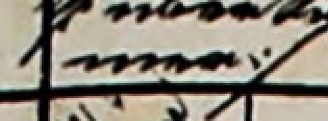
mer.
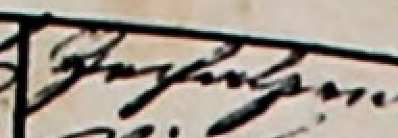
Zechalgen
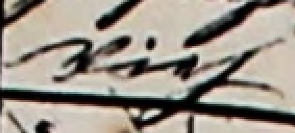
Vieh
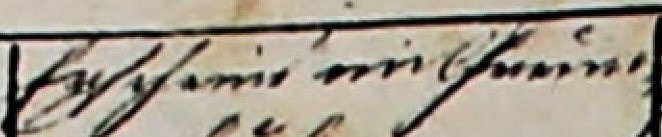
Erscheint im Grund„
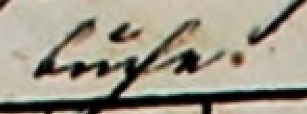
buche
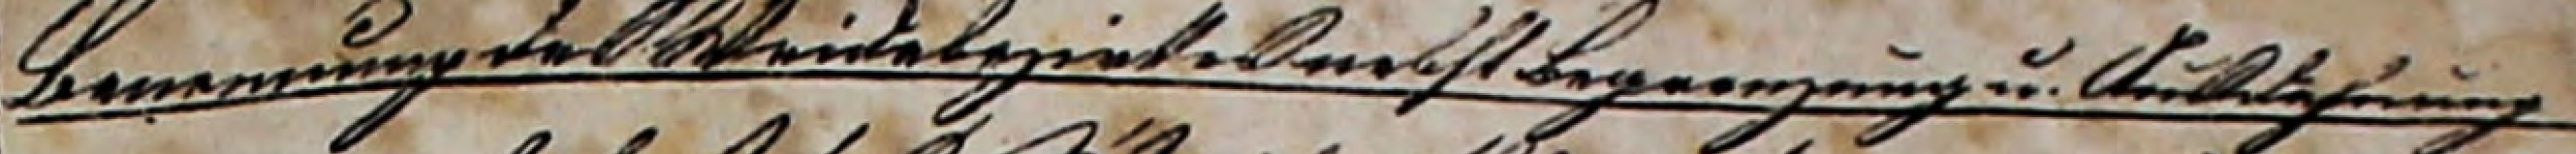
Benennung des Weidabezirkes nebst Begrenzung u. Ausdehnung
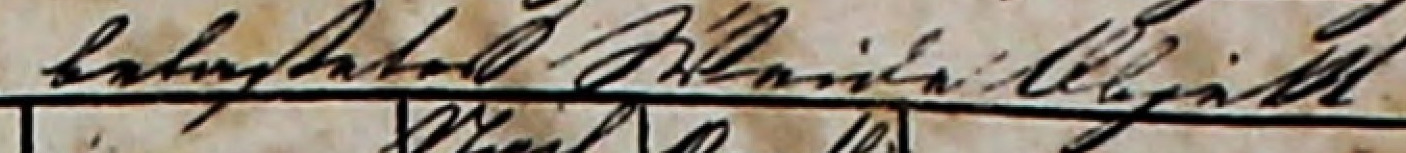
belaßetes Weide Objekt
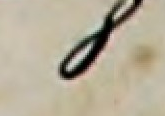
8
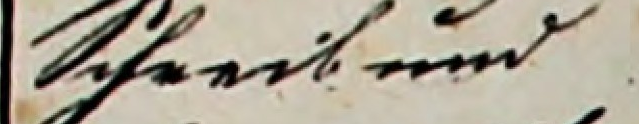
Schreib und
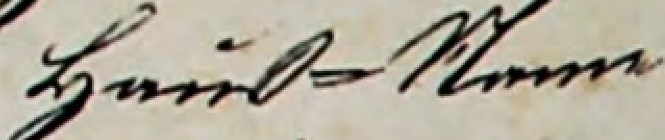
Haus=Name
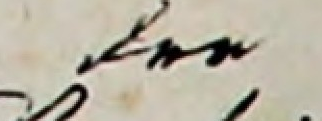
der
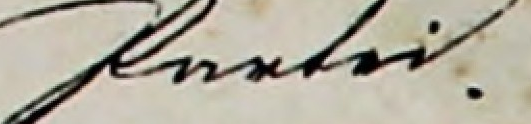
Partei
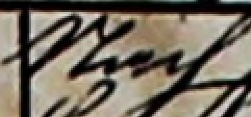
Nach
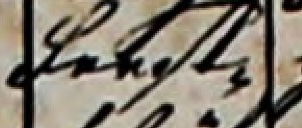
Seest„
